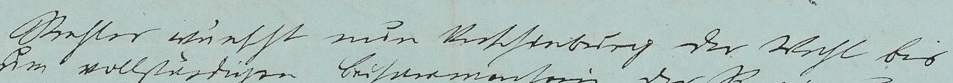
Strehler wünscht nun Verschiebung der Wahl bis
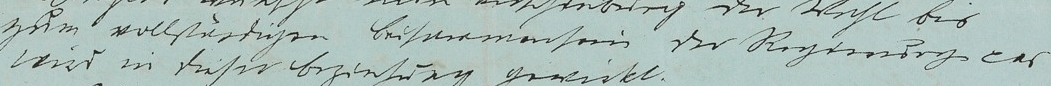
zum vollständigen Beisammensein der Regierung & es
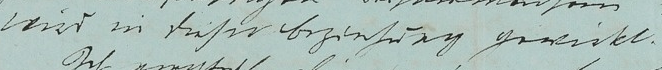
wird in dieser Beziehung gewirkt.
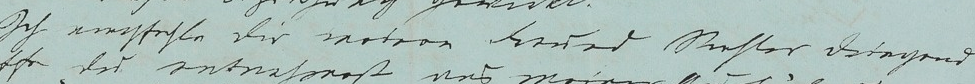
Ich empfehle dir meinen Freund Strehler dringend
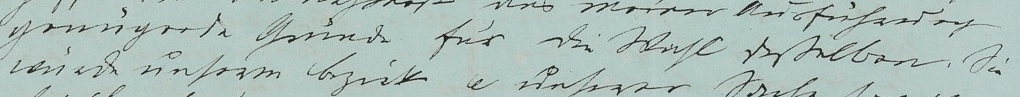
genügende Gründe für die Wahl desselben. Sie
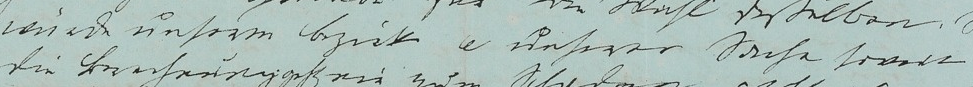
würde unserm Bezirk & unserer Sache soweit
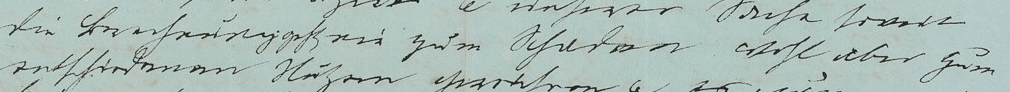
die Berechnung geht, nie zum Schaden wohl aber zum
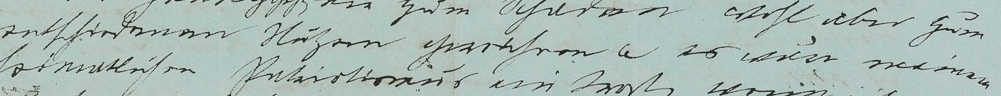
entschiedenen Nutzen gereichen & es wäre meinem
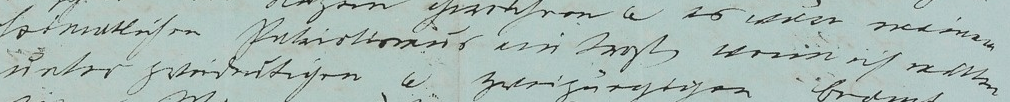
heimatlichen Patriotismus ein Trost, wenn ich mitten
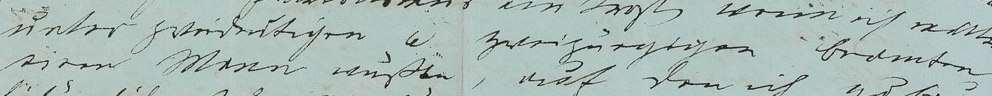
unter zweideutigen & zweizüngigen Beamten
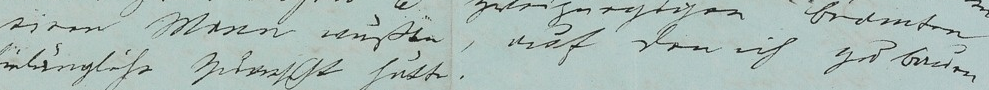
einen Mann wüßte, auf den ich zu bauen
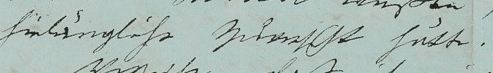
hinlängliche Zuversicht hätte.
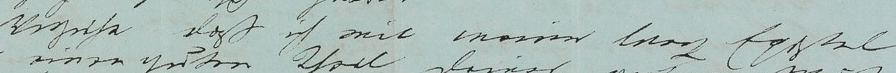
Verzeihe daß ich mit meiner langen Epistel
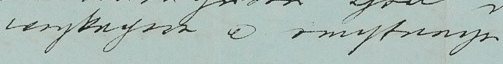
wegkapere & empfange
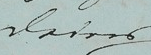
Deines
